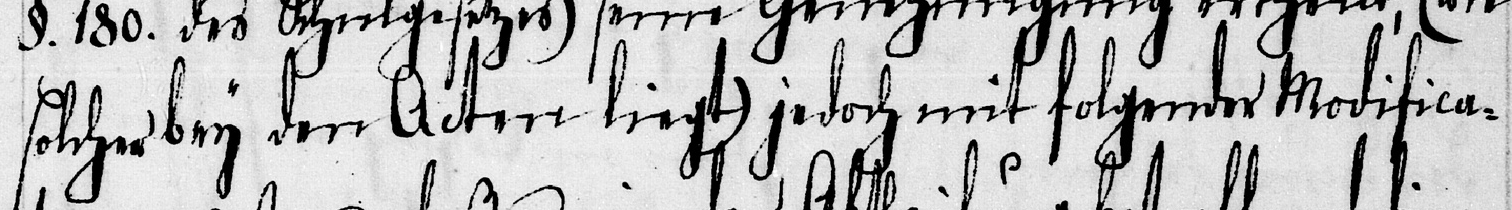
solcher bey den Acten liegt) jedoch mit folgender Modifica¬
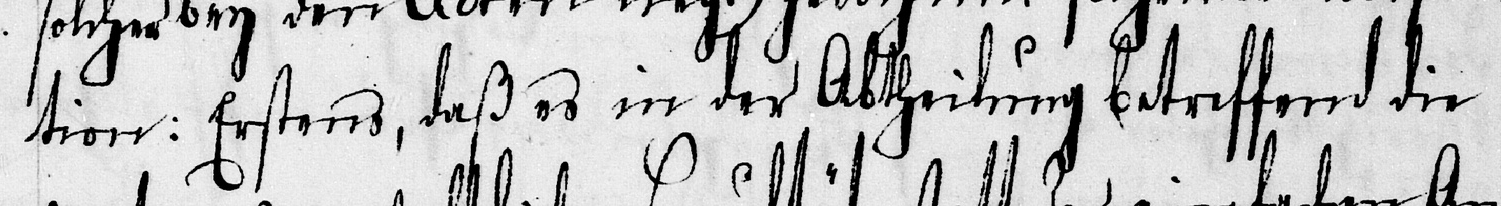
tion: Erstens, daß es in der Abtheilung betreffend die
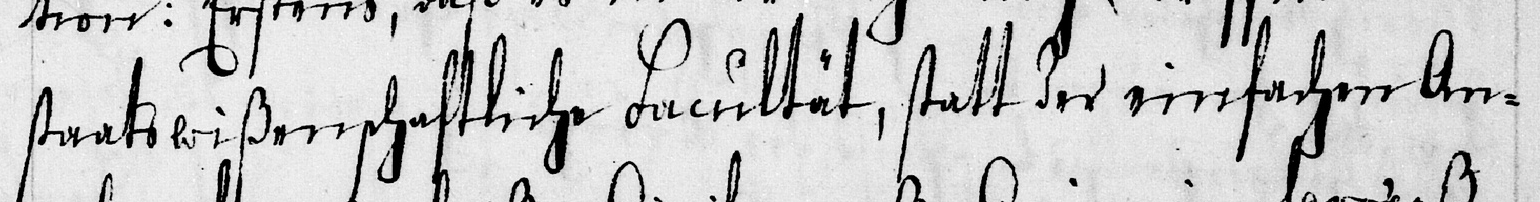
staatswißenschaftliche Facultät, statt der einfachen An¬
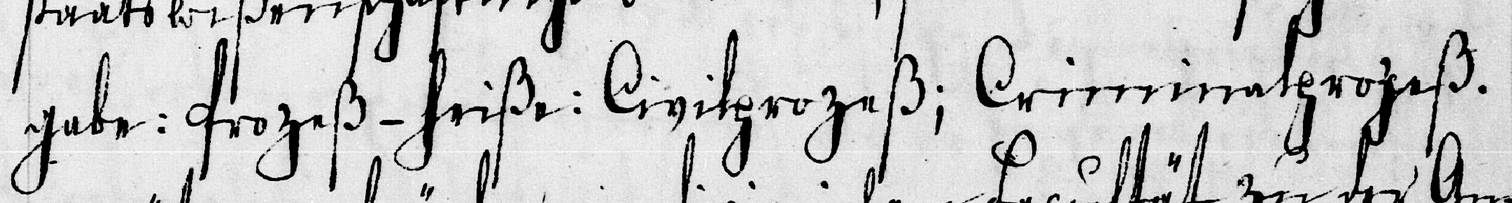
gabe: Prozeß – heiße: Civilprozeß; Criminalprozeß.
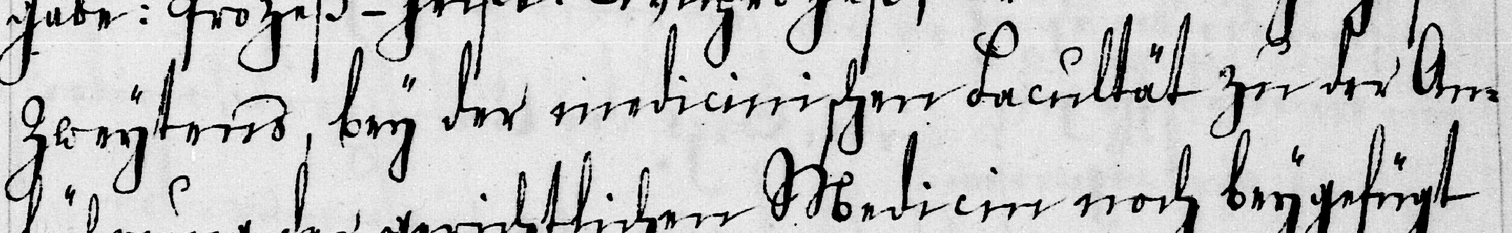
Zweytens, bey der medicinischen Facultät zu der An¬
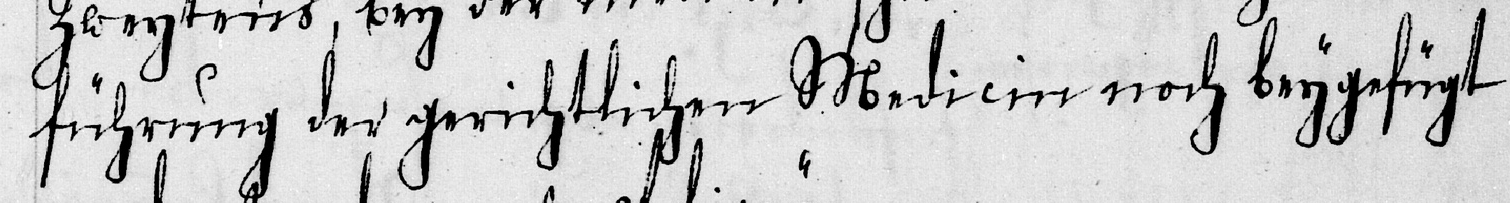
führung der gerichtlichen Medicin noch beygefügt
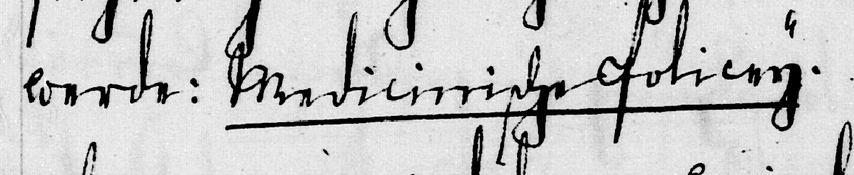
werde: Medicinische Policey.
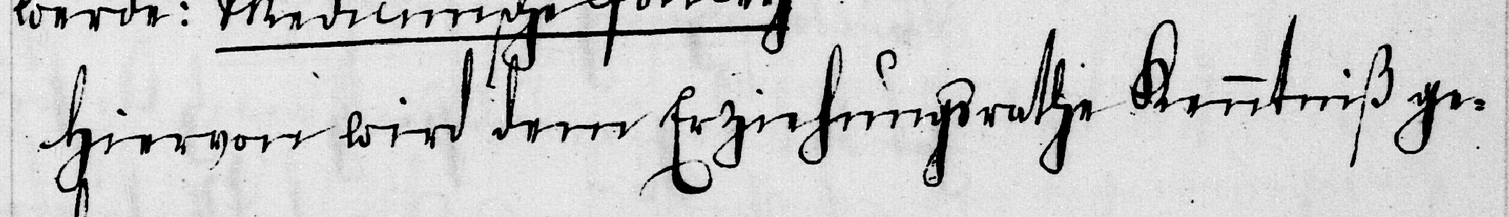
Hiervon wird dem Erziehungsrathe Kenntniß ge¬
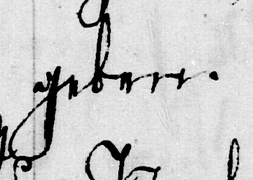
geben.
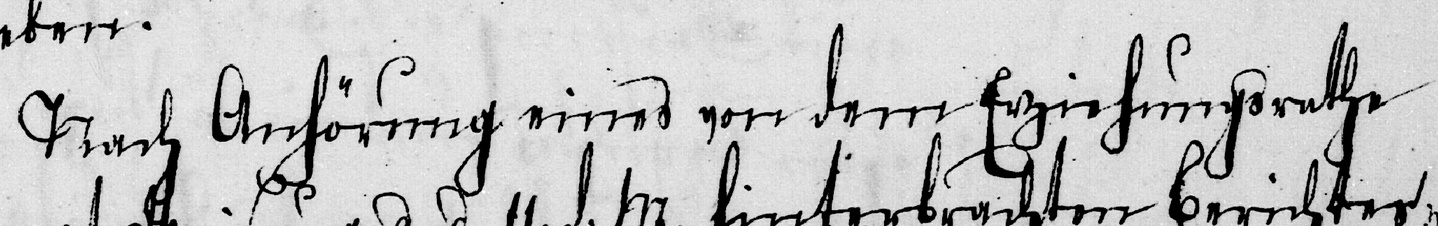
Nach Anhörung eines von dem Erziehungsrathe
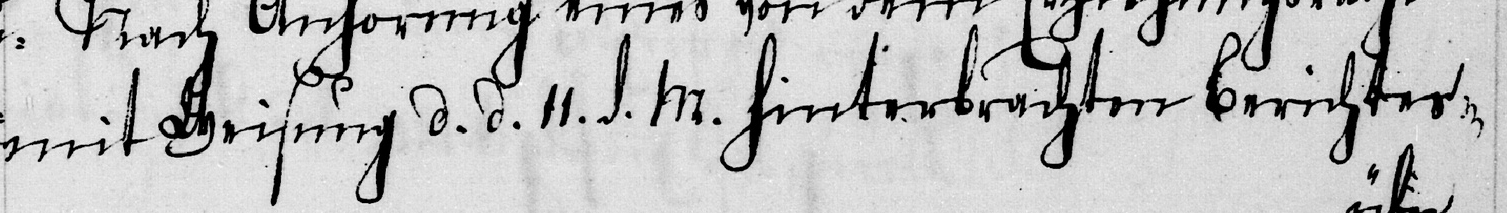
mit Weisung d. d. 11. d. M. hinterbrachten Berichtes
